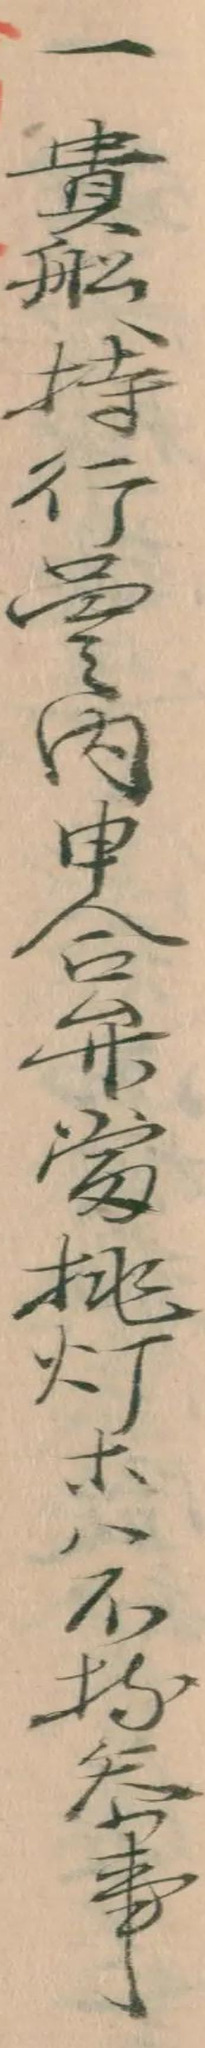一貴舩へ持行品之内申合弁當挑灯等ハ不持参事
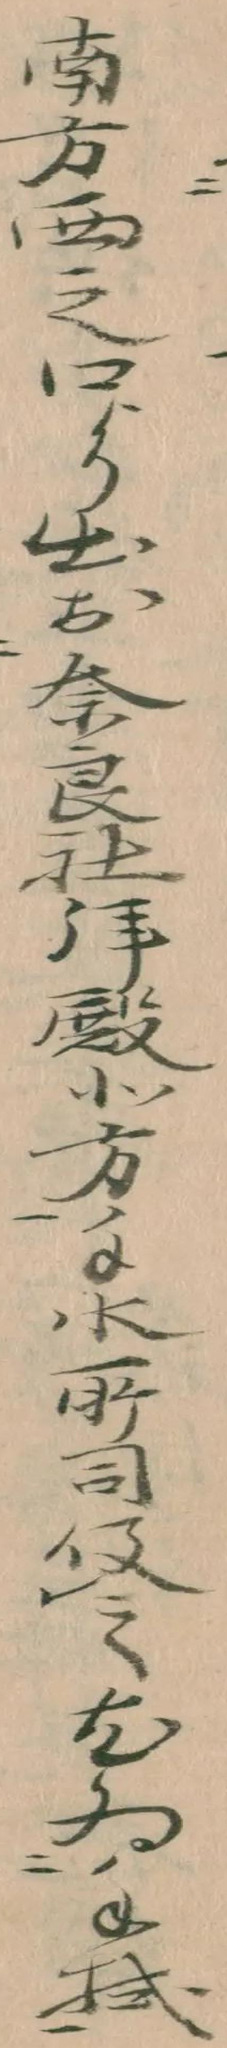南方西之口より出於奈良社拝殿北方手水所司役之尤為手拭

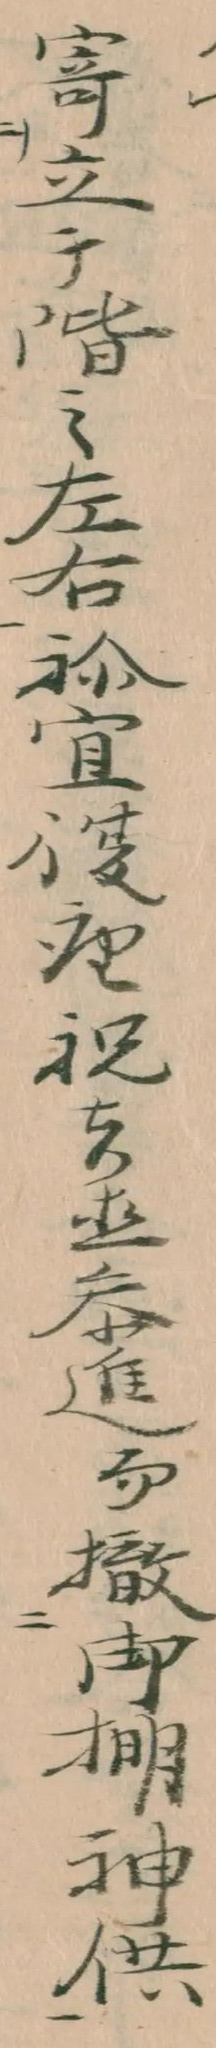寄立于階之左右祢宜復座祝者直参進而撒御棚神供
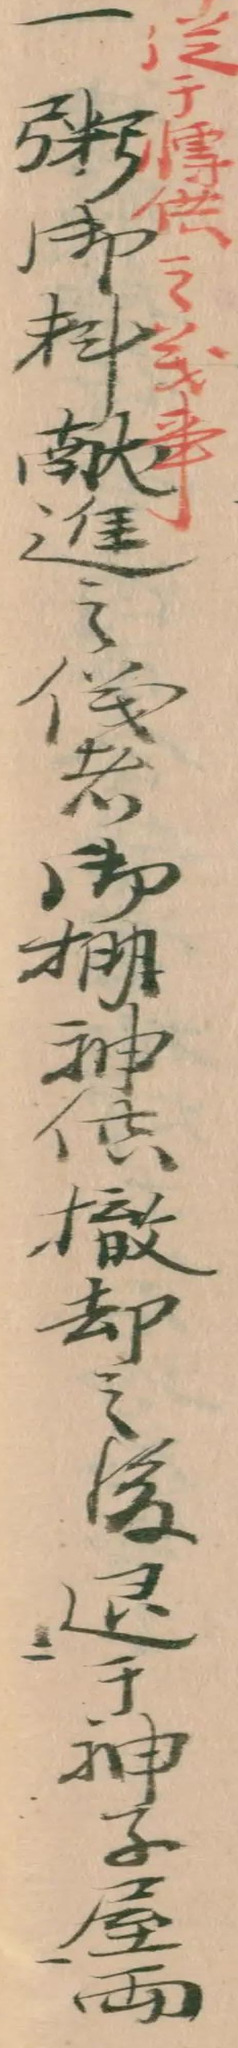一粥御料献進之儀は御棚神供撤却之後退于神子屋両
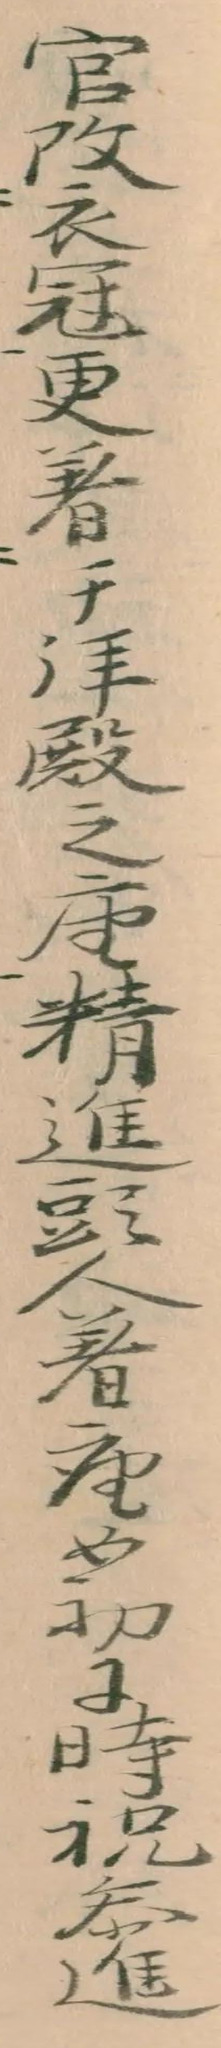官改衣冠更着于拝殿之座精進頭人着座如初于時祝天進
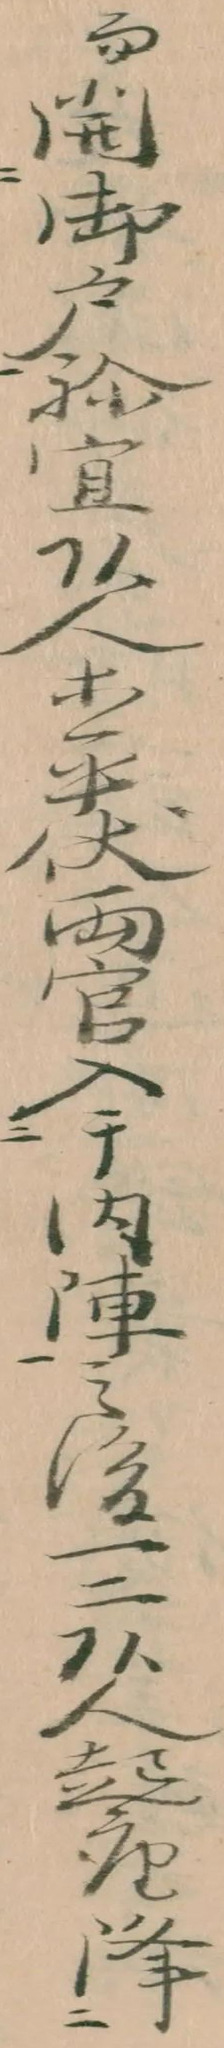而開御戸祢宜頭人等平伏両官入于内陣之後一二頭人起座降
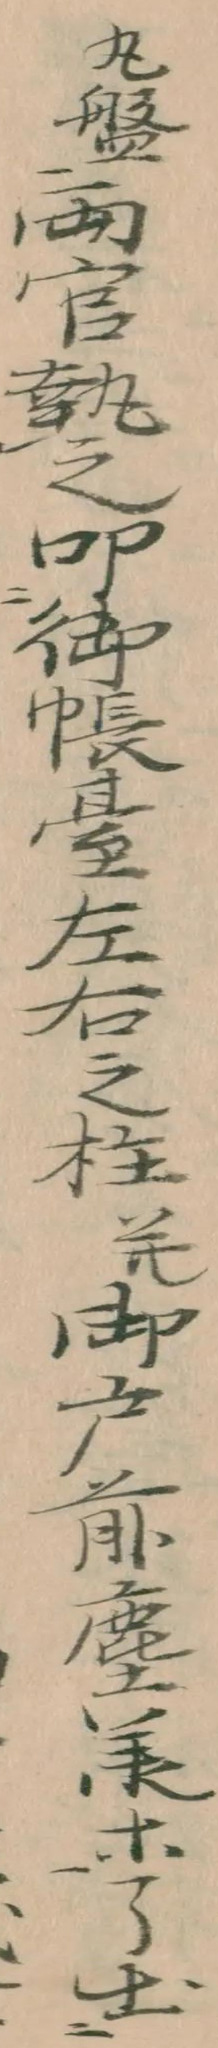丸盤両官執之御帳臺左右之柱并御戸前塵承等了出

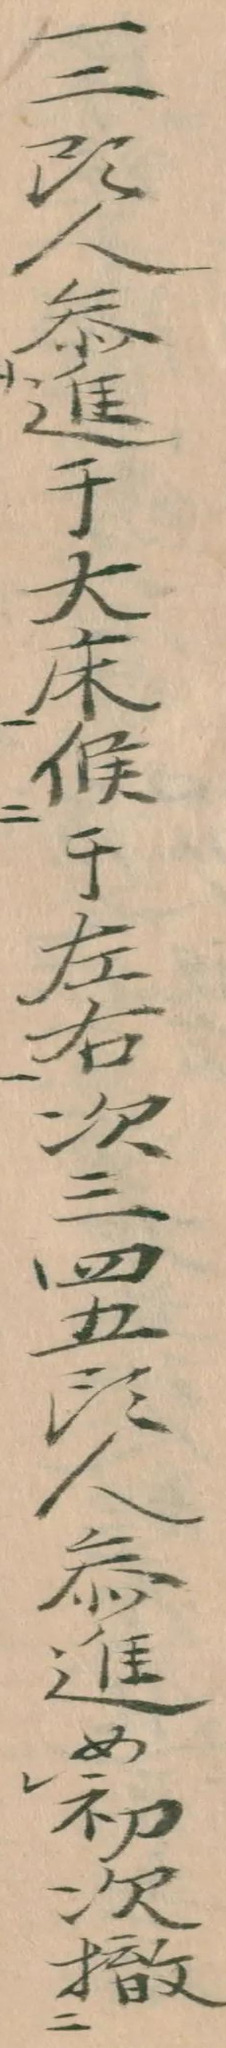一二頭人参進于大床候于左右次三四五頭人参進如初次撒
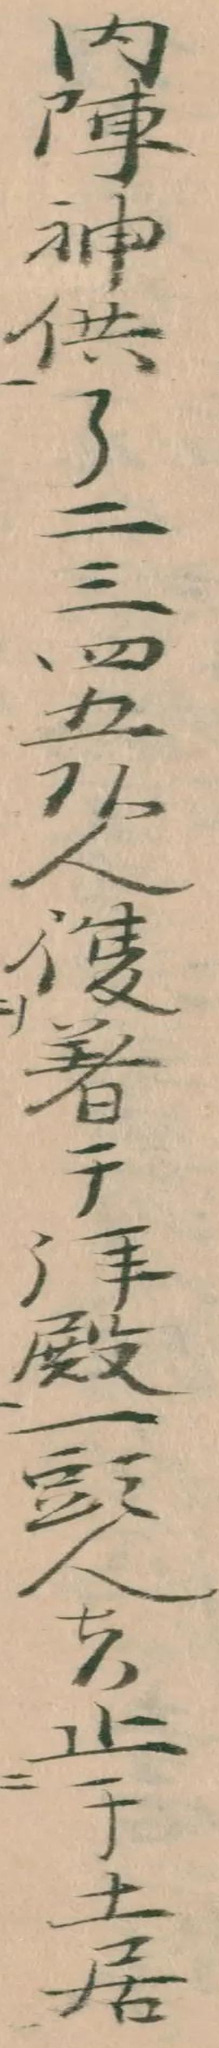内陣神供了二三四五頭人復着于拝殿一頭人者止于土居
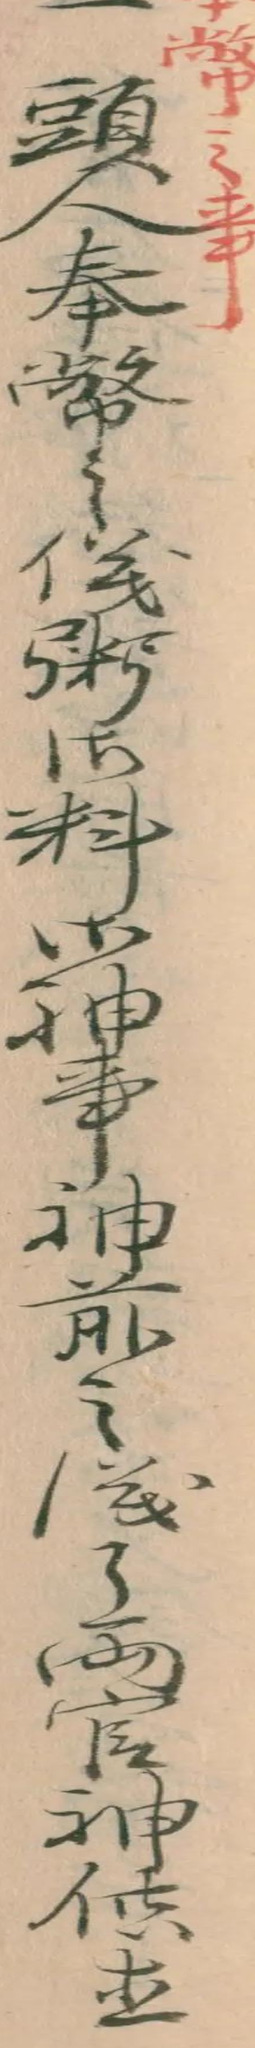一頭人奉幣之儀粥御料御神事神前之儀了両官神供直
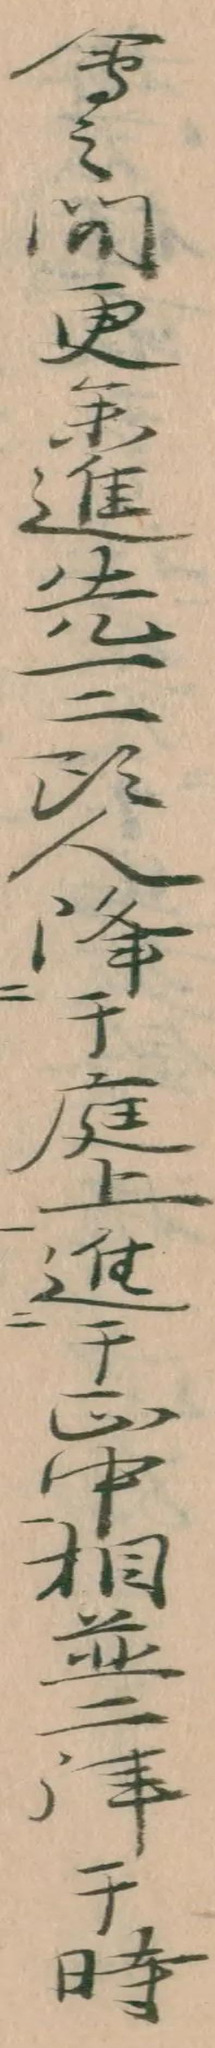會之間更参進先一二頭人降于庭上進于正中相並二拝于時
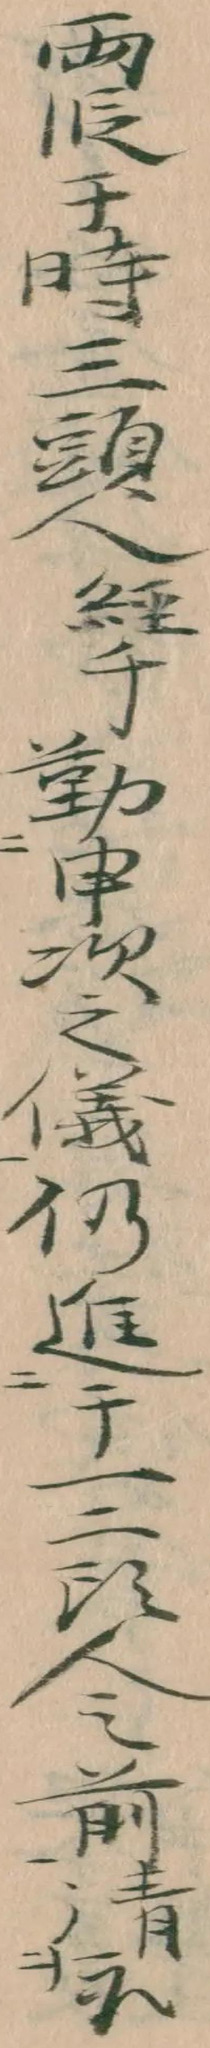両段于時三頭人経千勤申次之儀仍進于一二頭人之前請取
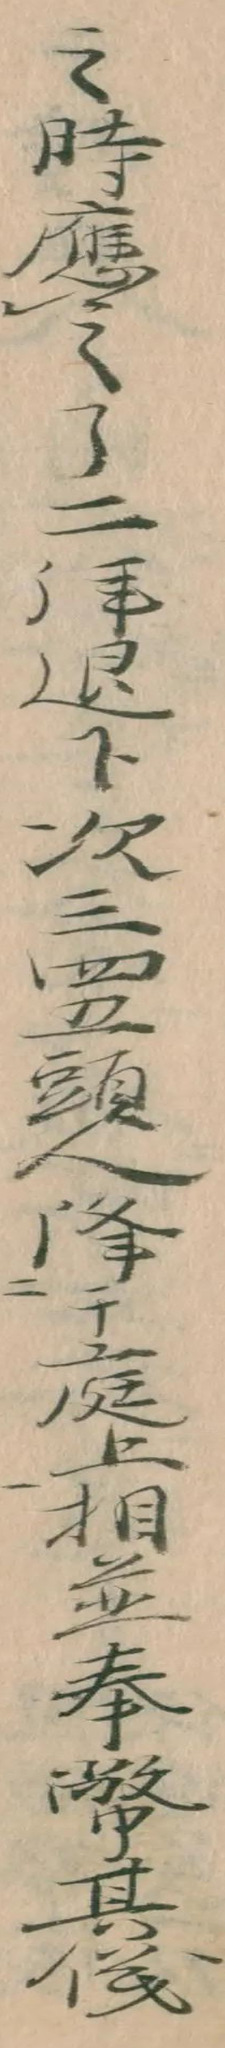之時應之了二拝退下次三四五頭人降于庭上相並奉幣其儀
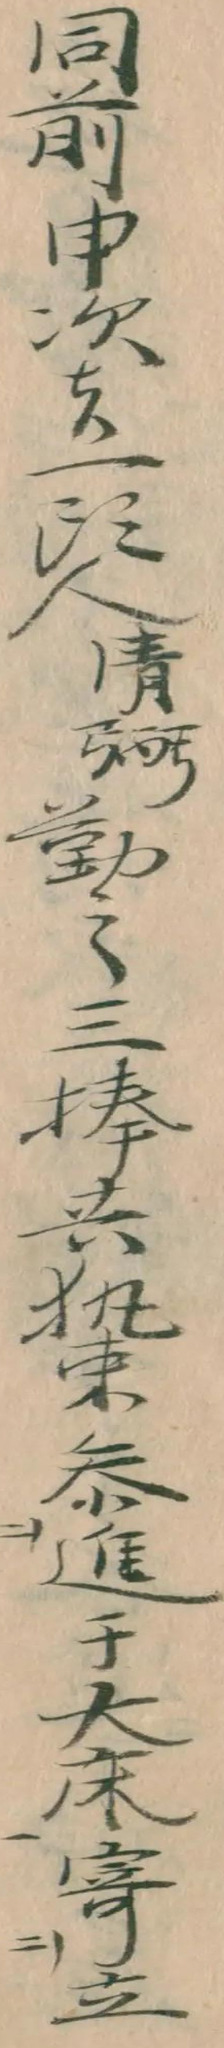同前申次は一頭人清弼勤之三棒共執束参進于大床寄立

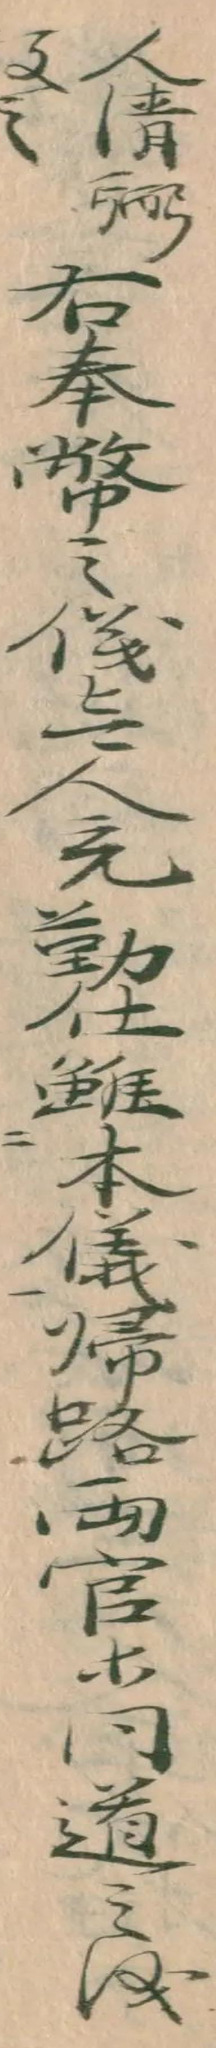人清弼役之右奉幣之儀壱人充勤仕雖本儀帰路両官等同道之儀
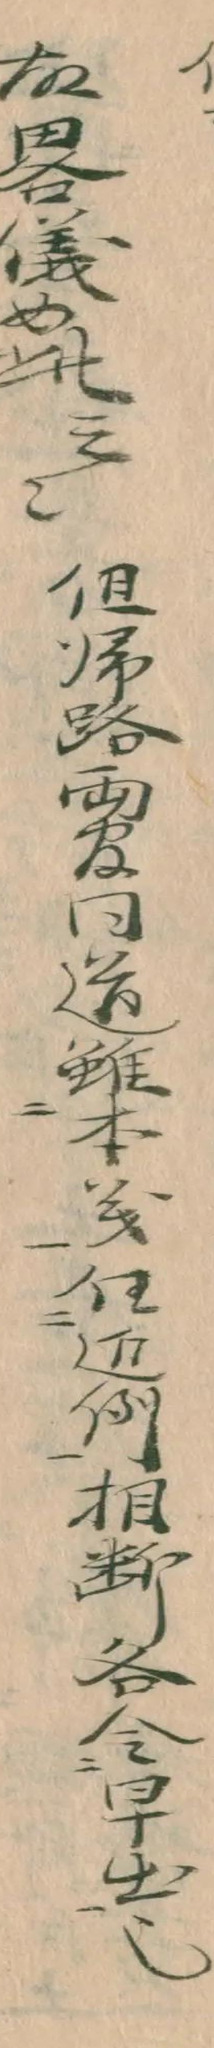故畧儀如此云々但帰路両官同道雖本義任近例相断各令早出也
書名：賀茂社記録. 第74冊
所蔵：国立国会図書館 National Diet Library, JAPAN
